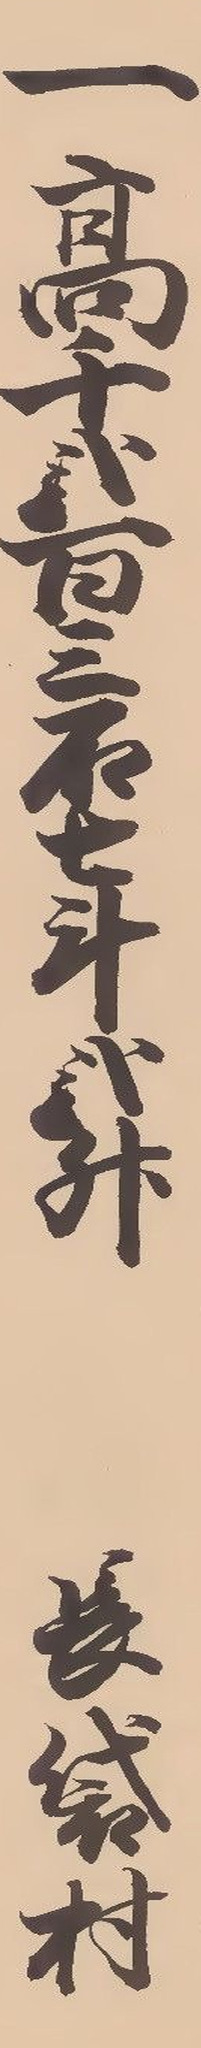一高千弐百三石七斗弐升長袋村
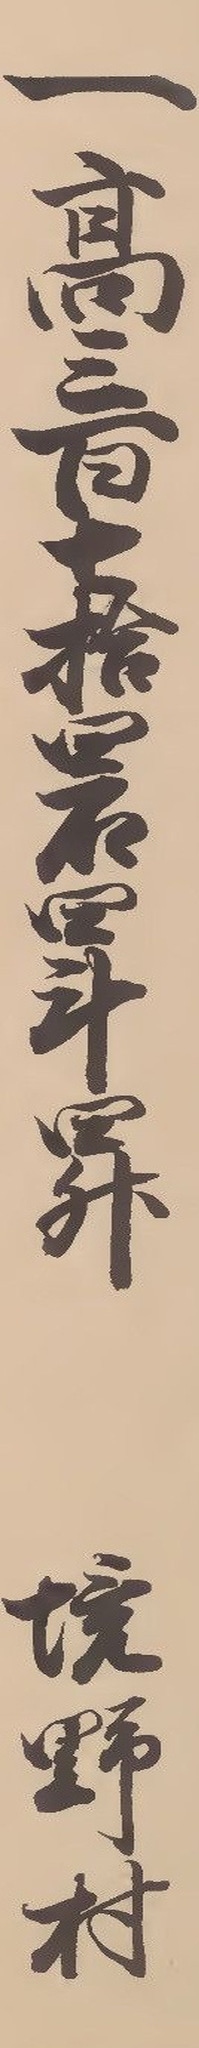一高三百七拾四石四斗四升境野村
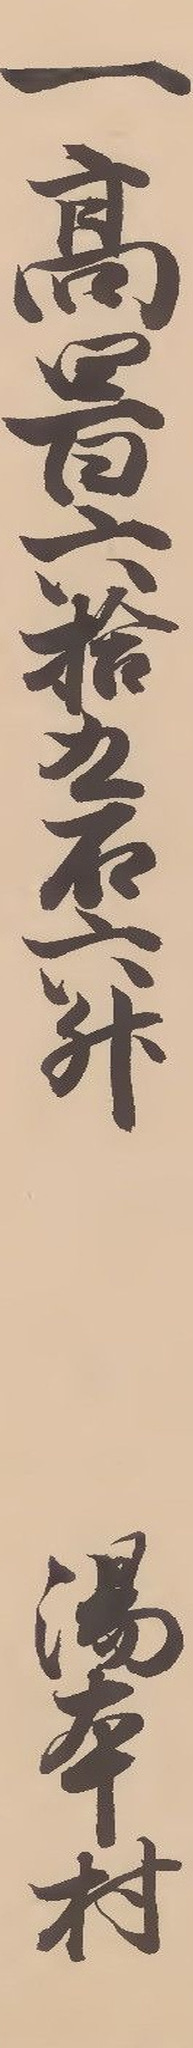一高四百六拾九石六升湯本村
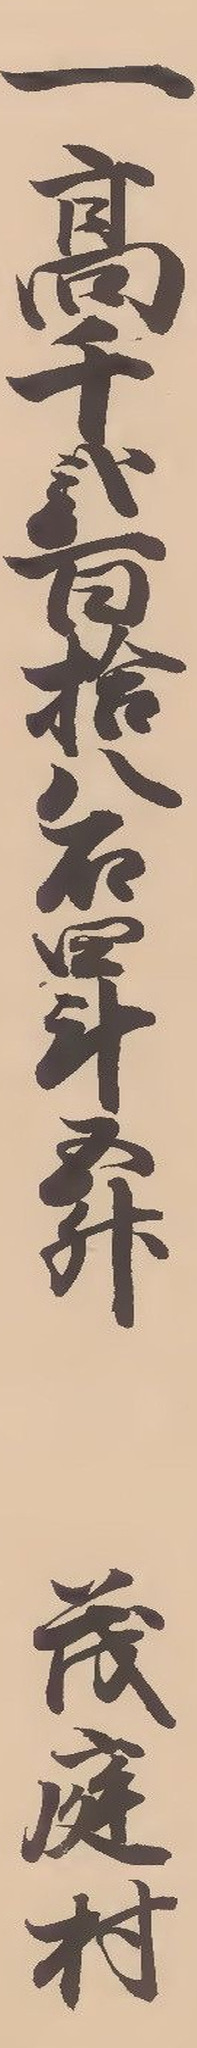一高千弐百拾八石四斗五升茂庭村
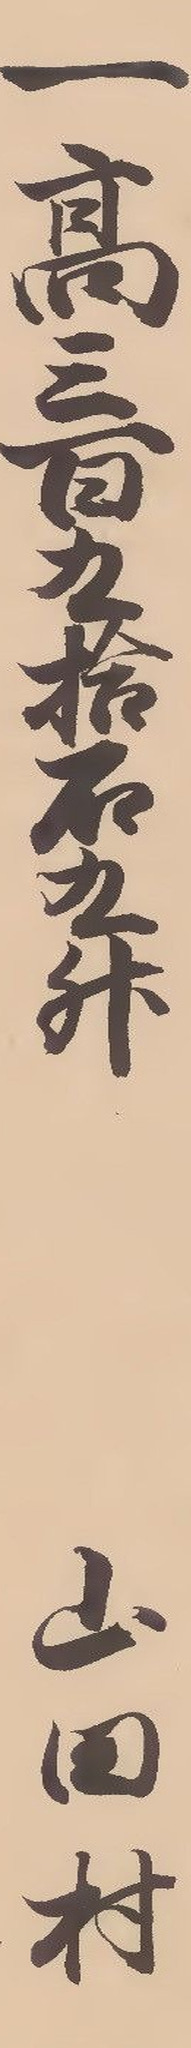一高三百九拾石九升山田村

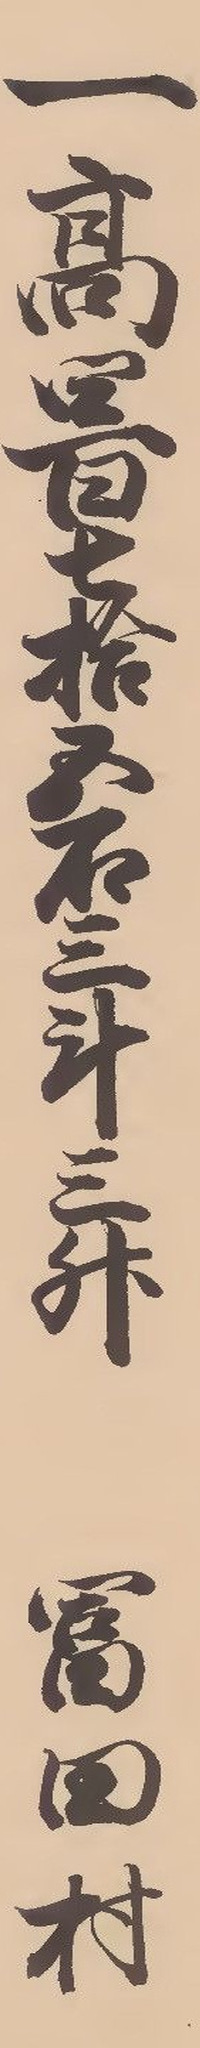一高四百七拾五石三斗三升富田村
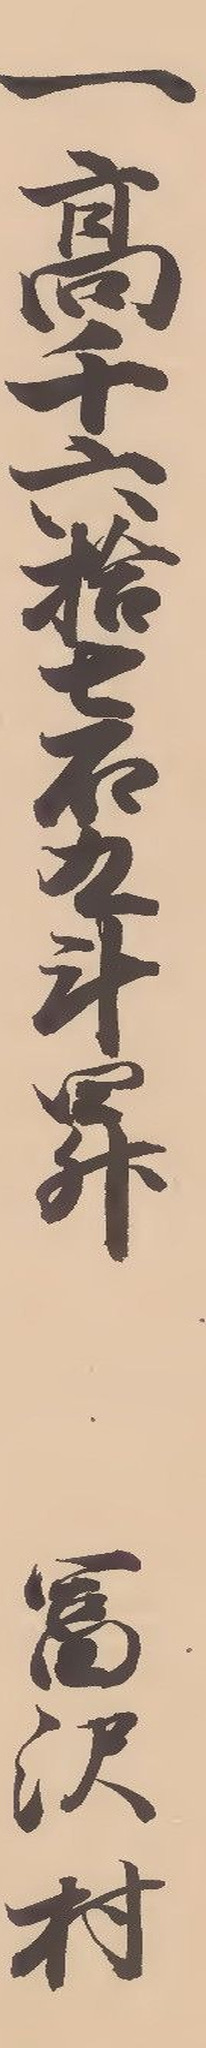一高千六拾七石九斗四升富沢村
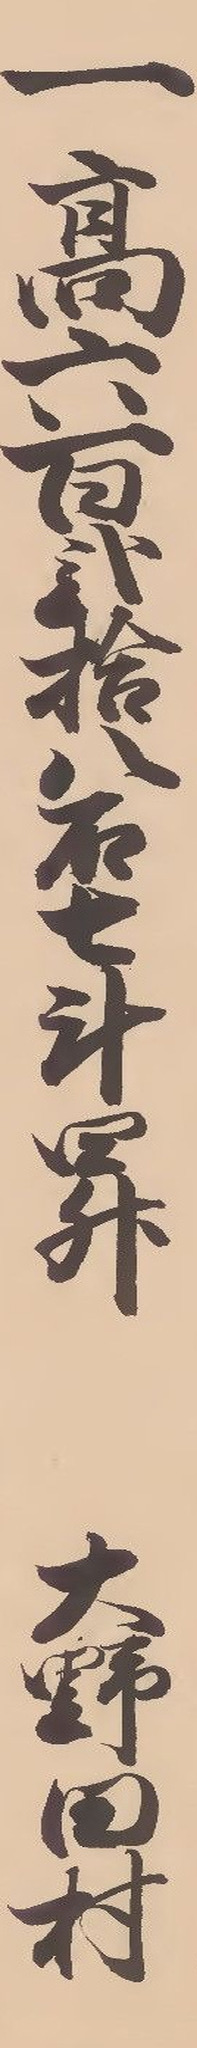一高六百弐拾八石七斗四升大野田村
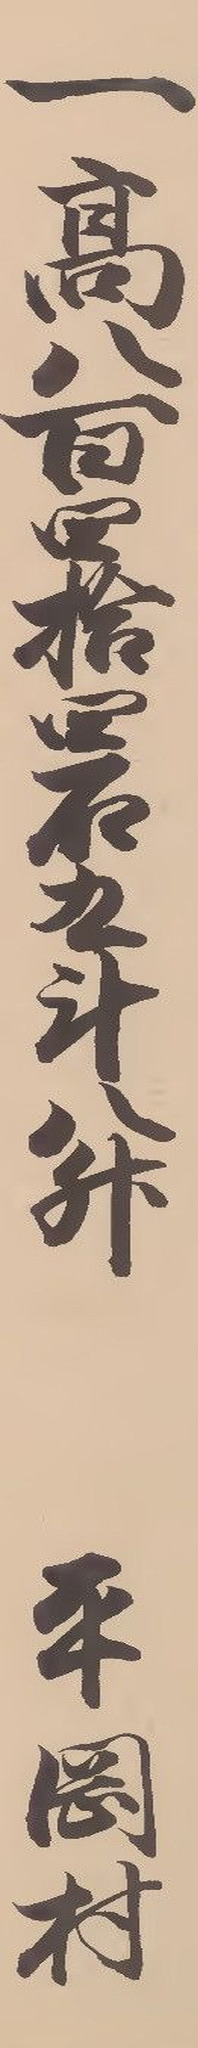一高八百四拾四石九斗八升平岡村
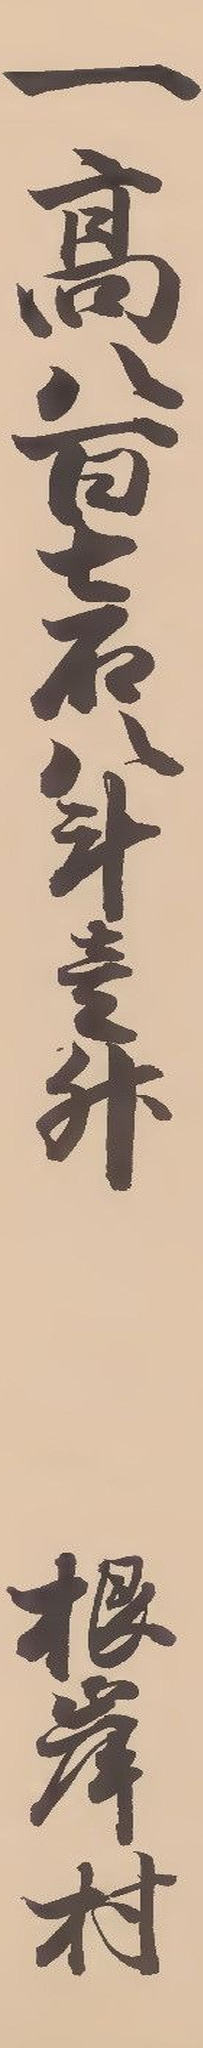一高八百七石八斗壱升根岸村
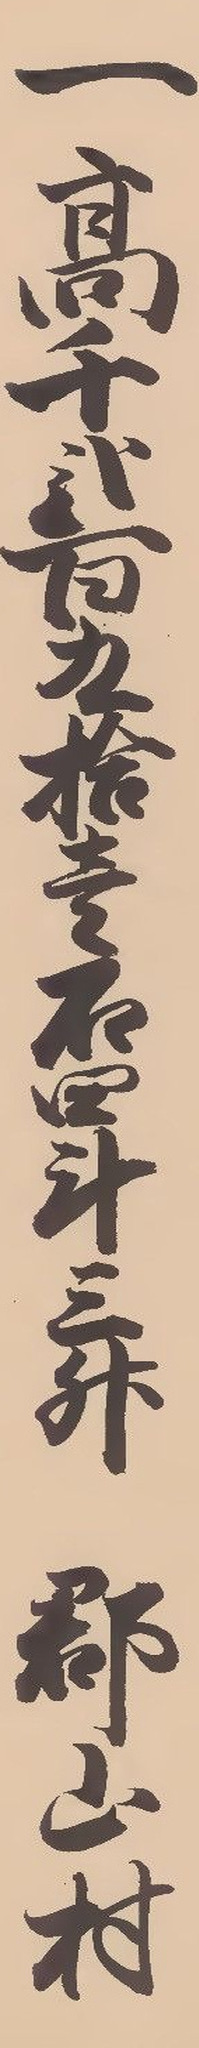一高千弐百九拾壱石四斗三升郡山村
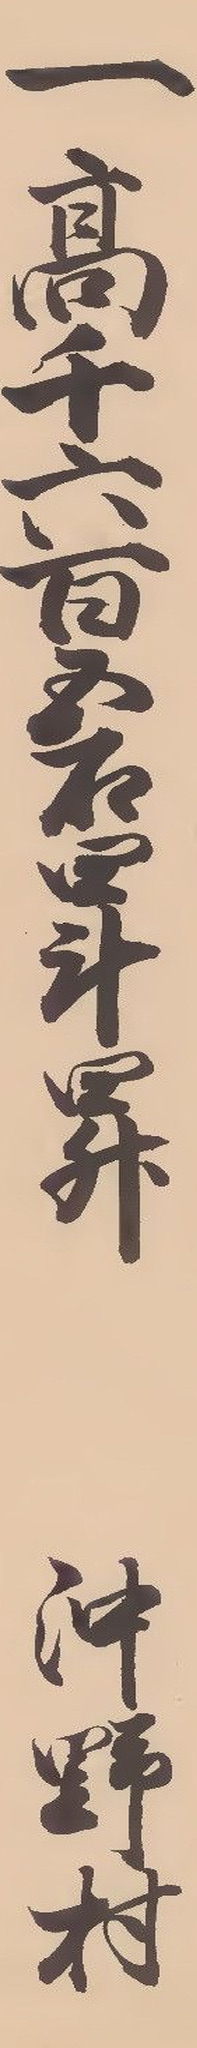一高千六百五石四斗四升沖野村

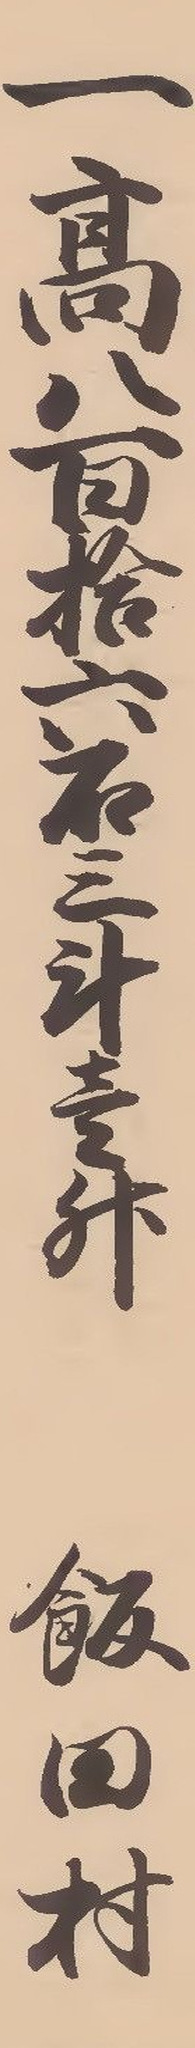一高八百拾六石三斗壱升飯田村
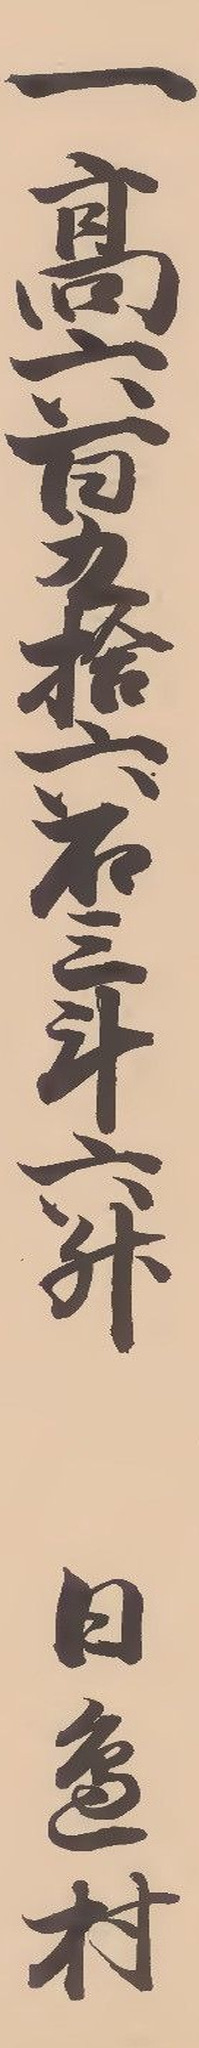一高六百九拾六石三斗六升日辺村
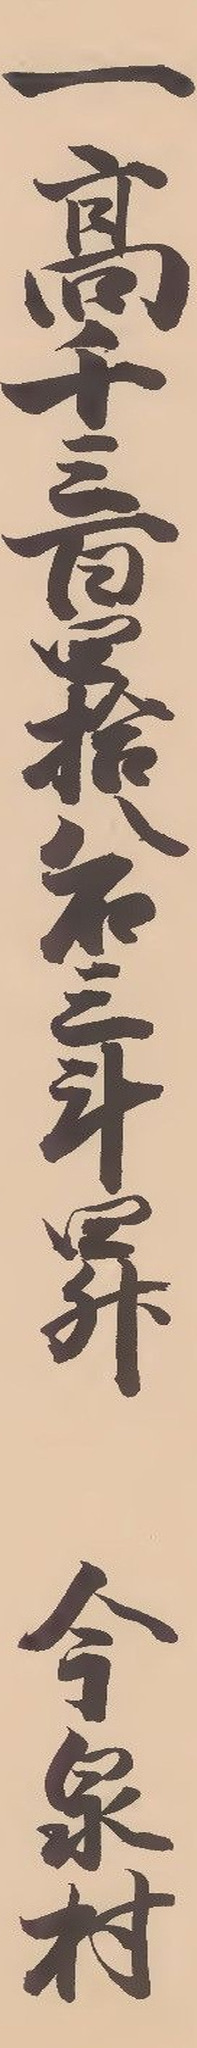一高千三百四拾八石三斗四升今泉村
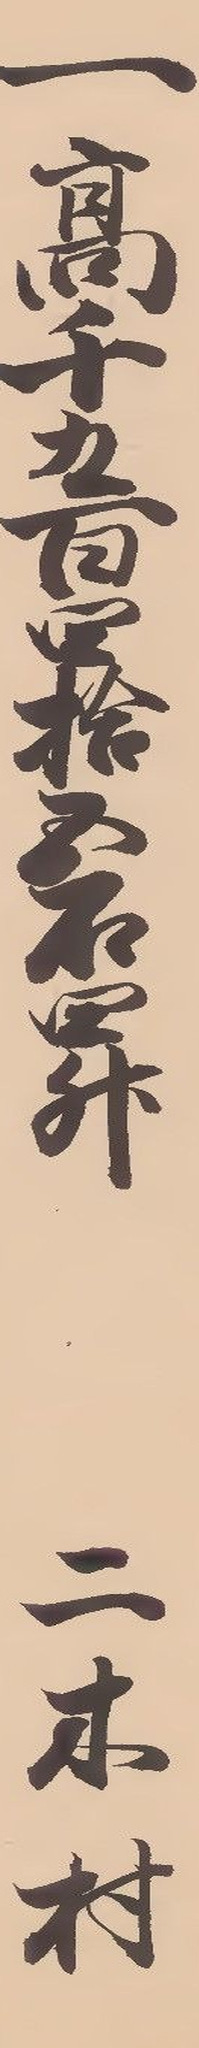一高千九百四拾五石四升二木村
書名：陸奥国郷帳　５
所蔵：国立公文書館 National Archives of Japan
